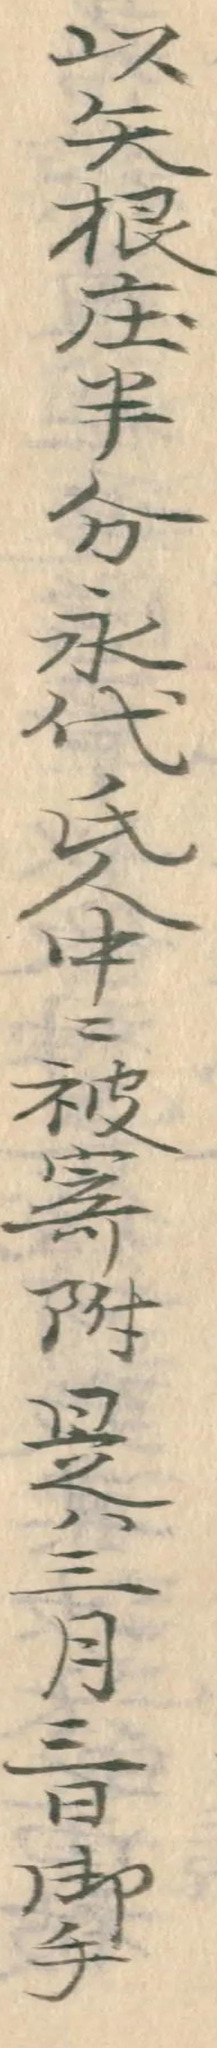以矢根庄半分永代氏人中ニ被寄附是ハ三月三日御手
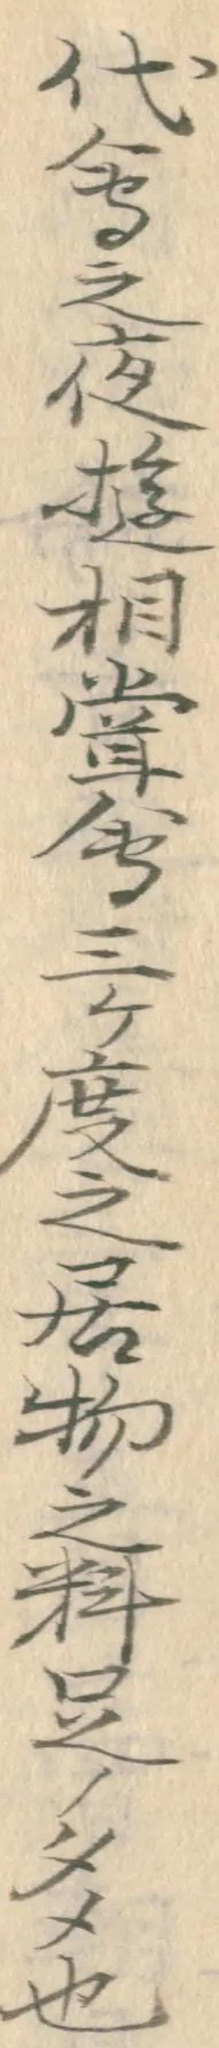代会之夜遊相嘗会三ケ度之居物之料足ノタメ也
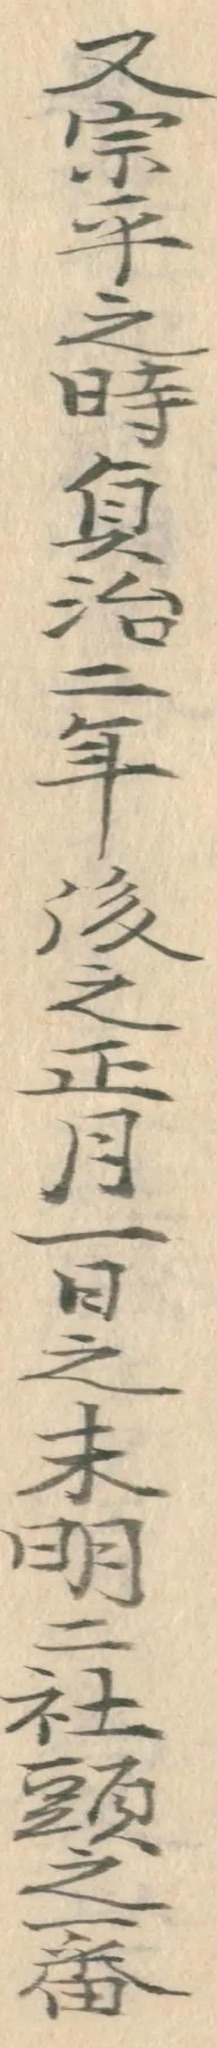又宗平之時貞治二年後之正月一日之未明二社頭之一番
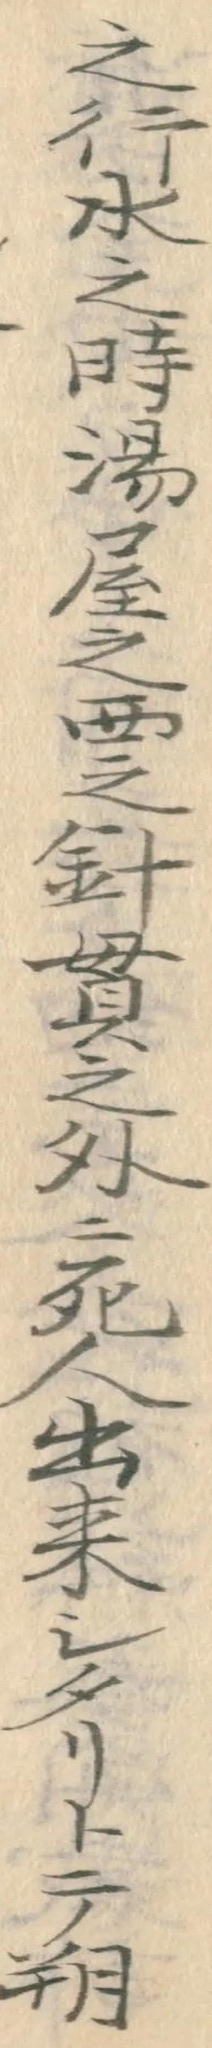之行水之時湯屋之西之針貫之外ニ死人出来シタリトテ朔
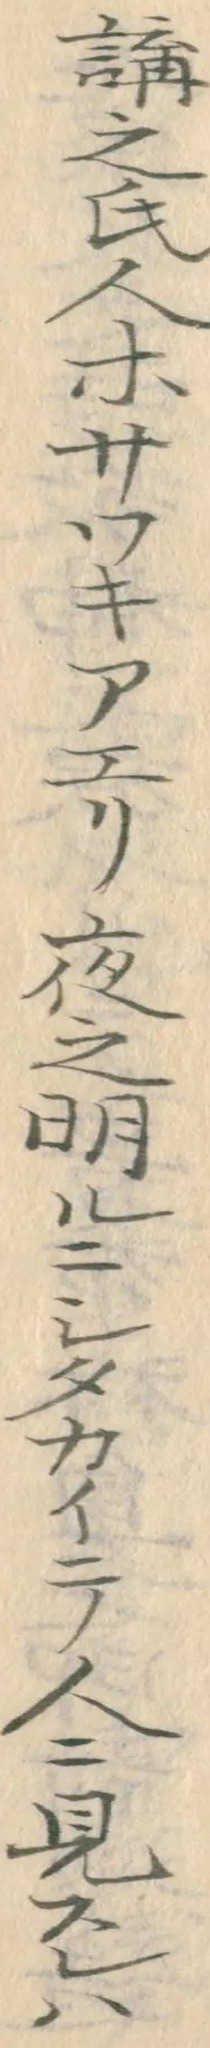講之氏人等サワキアエリ夜之明ルニシタカイテ人ニ見スレハ
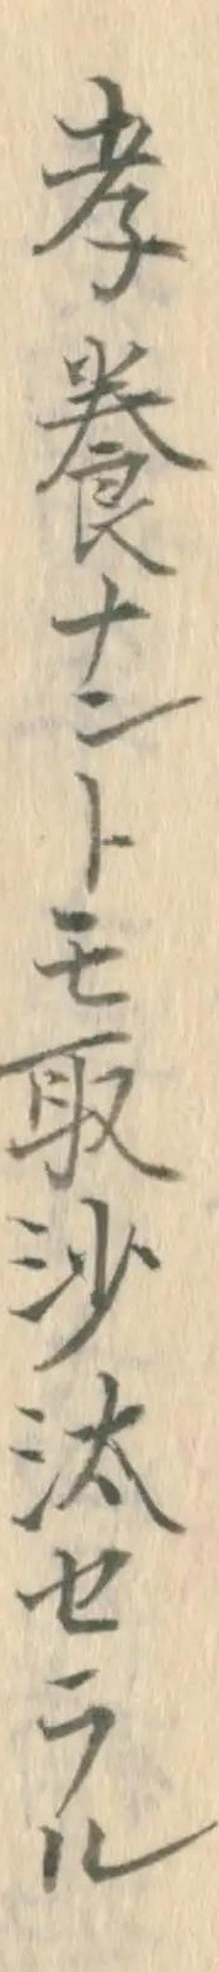孝養ナントモ取沙汰セラル
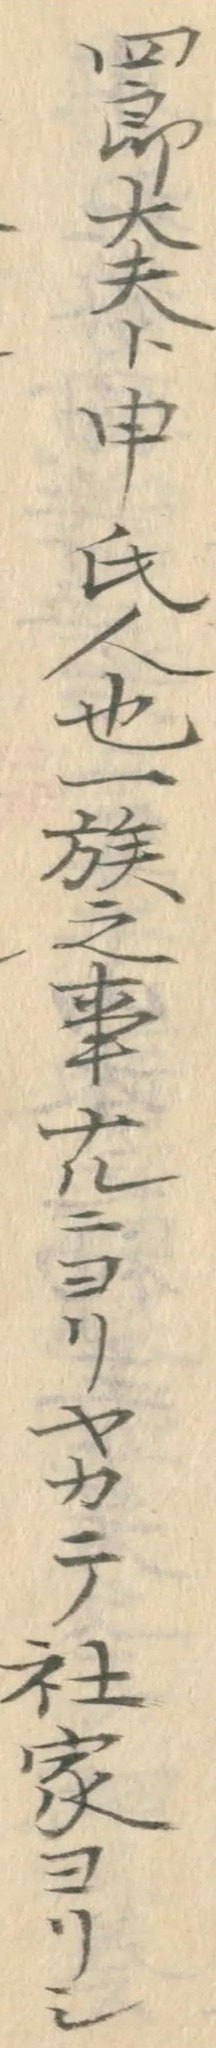四郎大夫ト申氏人也一族之事ナルニヨリヤカテ社家ヨリシ

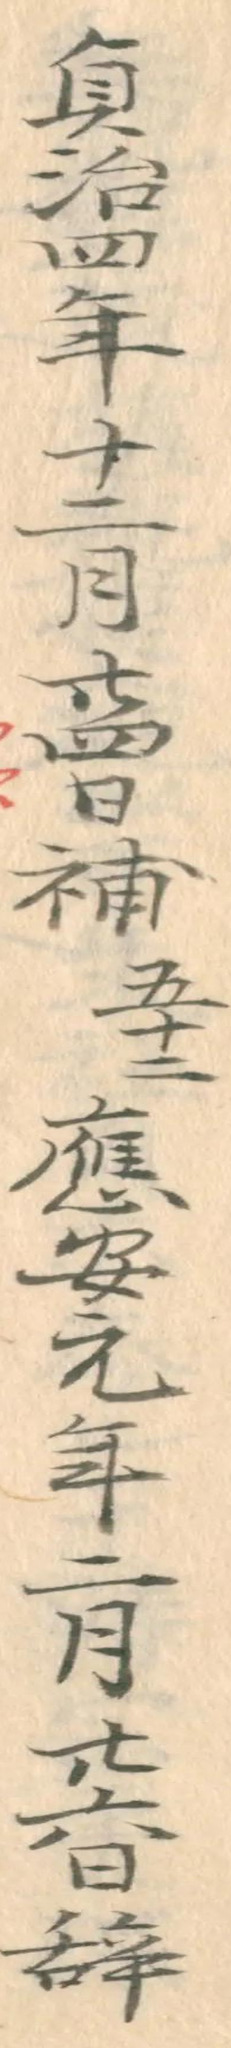貞治四年十二月廿四日補五十二応安元年二月廿六日辞
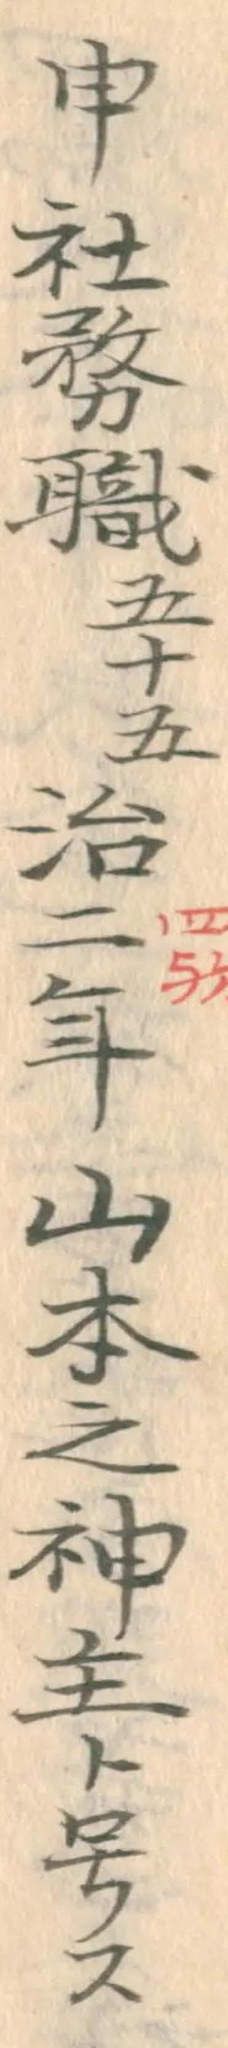申社務職五十五治二年山本之神主ト号ス
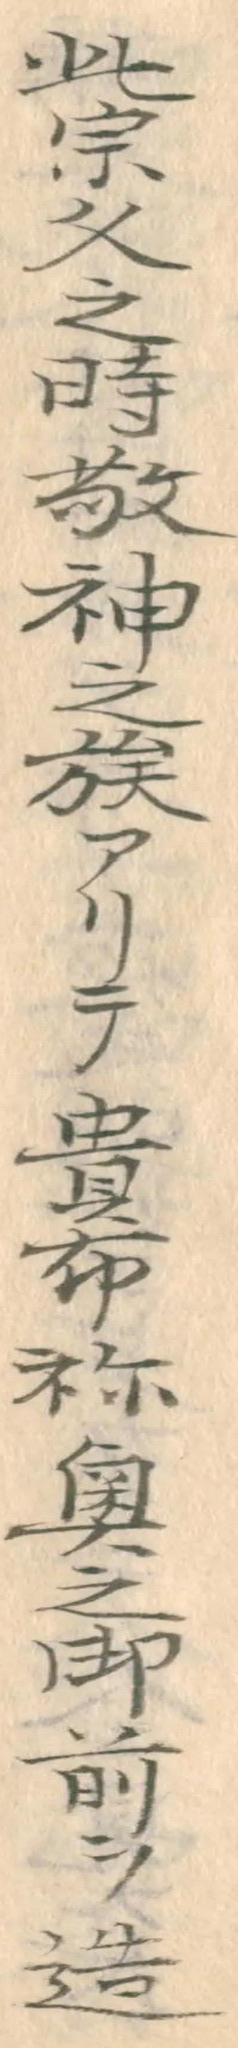此宗久之時敬神之族アリテ貴布祢奥之御前ヲ造
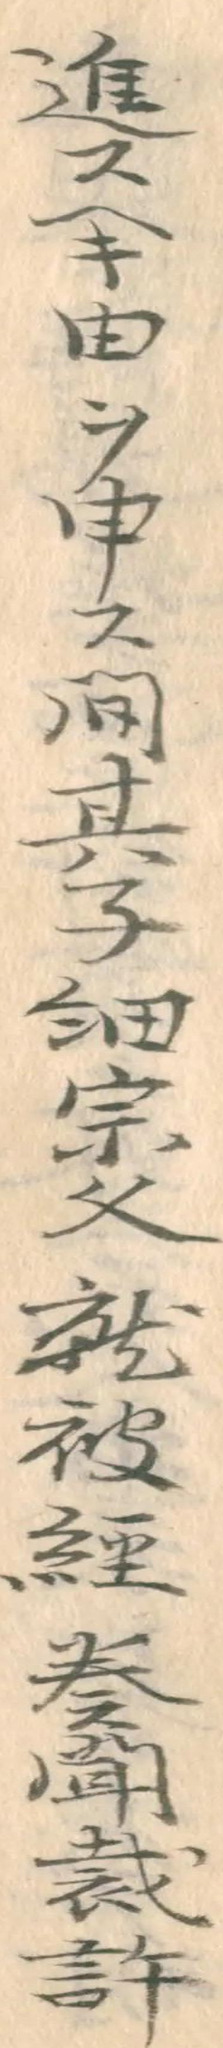進スヘキ由ヲ申ス間其子細宗久就被経奏聞裁許
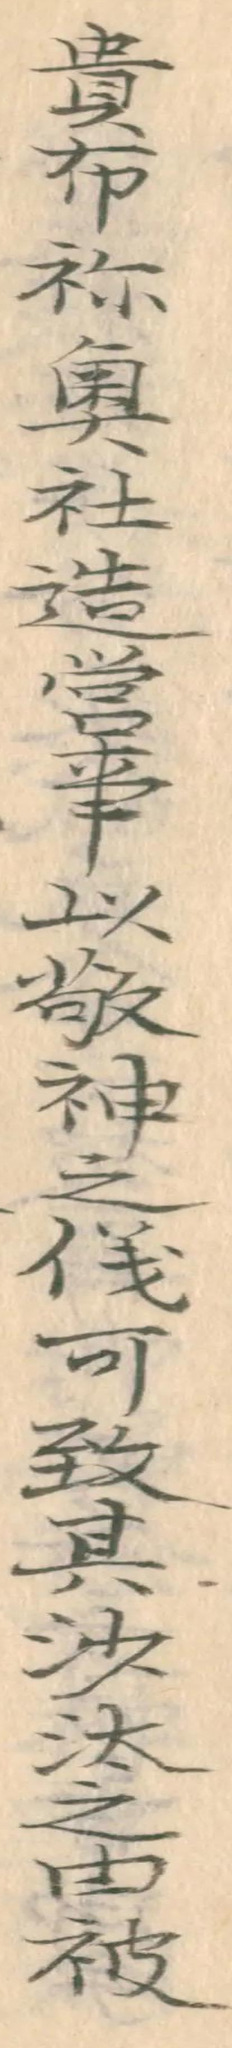貴布祢奥社造営事以敬神之儀可致其沙汰之由被
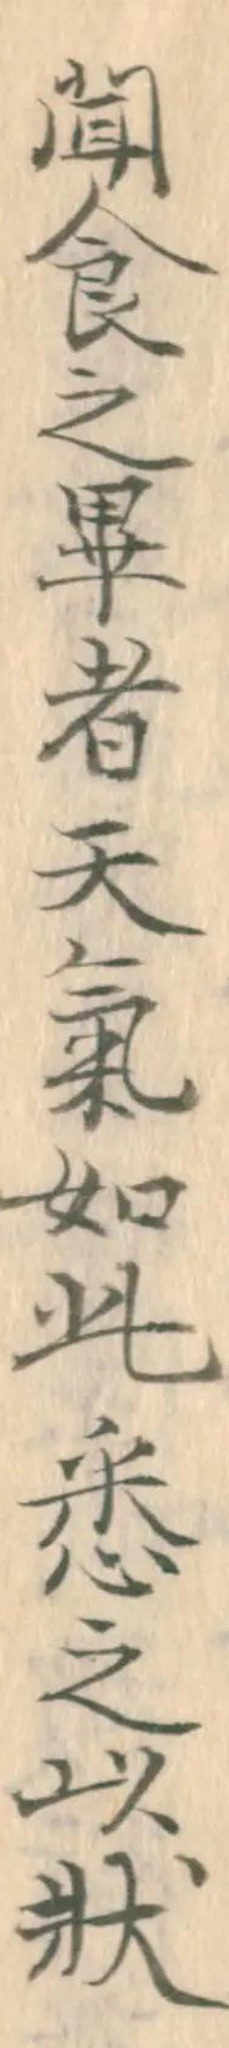聞食之畢者天気如此悉之以状
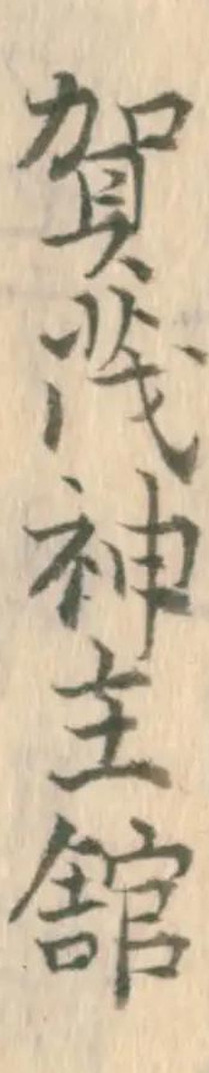賀茂神主舘
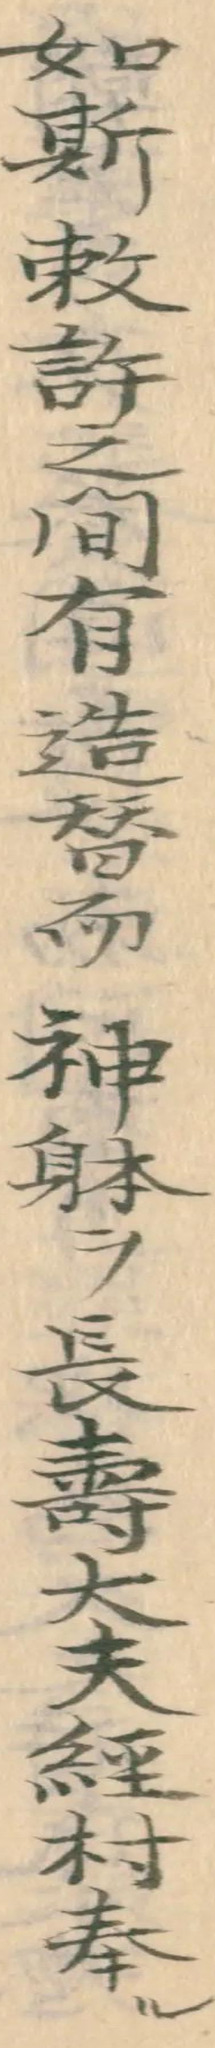如斯敕許之間有造替而神体ヲ長寿大夫経村奉ル
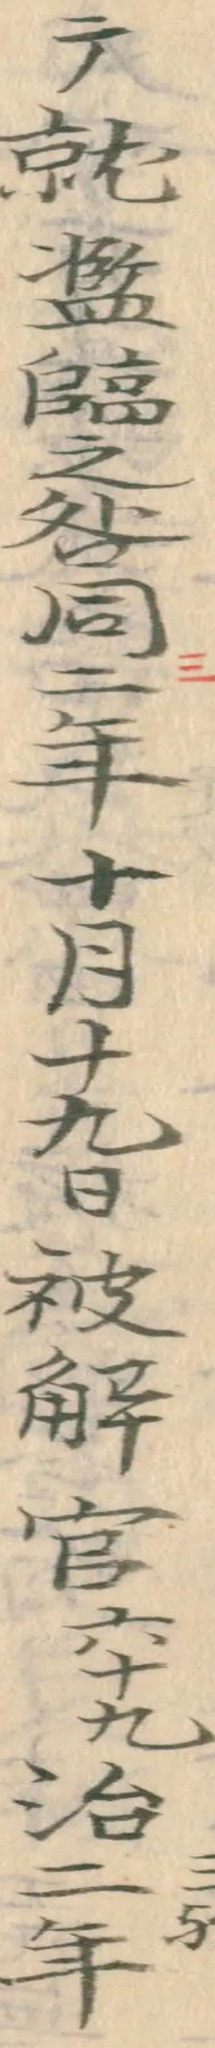テ就濫臨之咎同二年十月十九日被解官六十九治二年
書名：賀茂社記録. 第24冊
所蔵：国立国会図書館 National Diet Library, JAPAN
